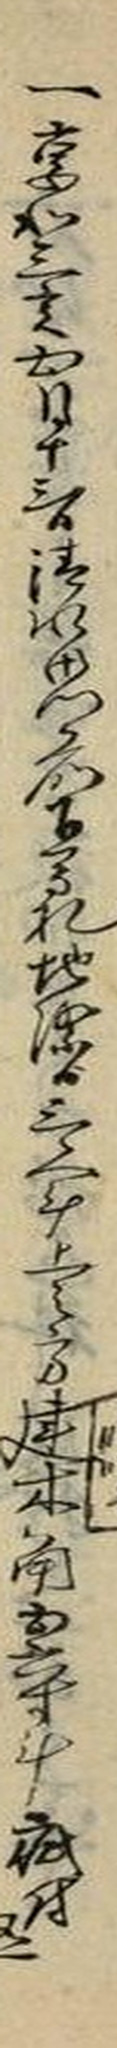一享和三亥五月十三日清水御門前下馬札地際ゟ三尺斗上之方建木角五六寸斗疵付有
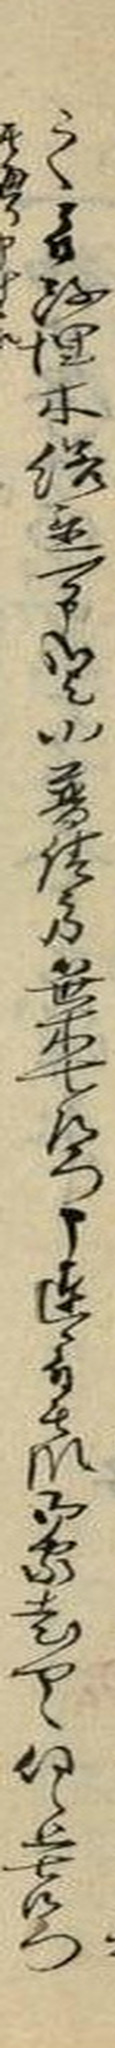之に付致埋木繕置可申哉と小普請方笹木七左衛門申達候に付其段御家老中へ伺候上七左衛門
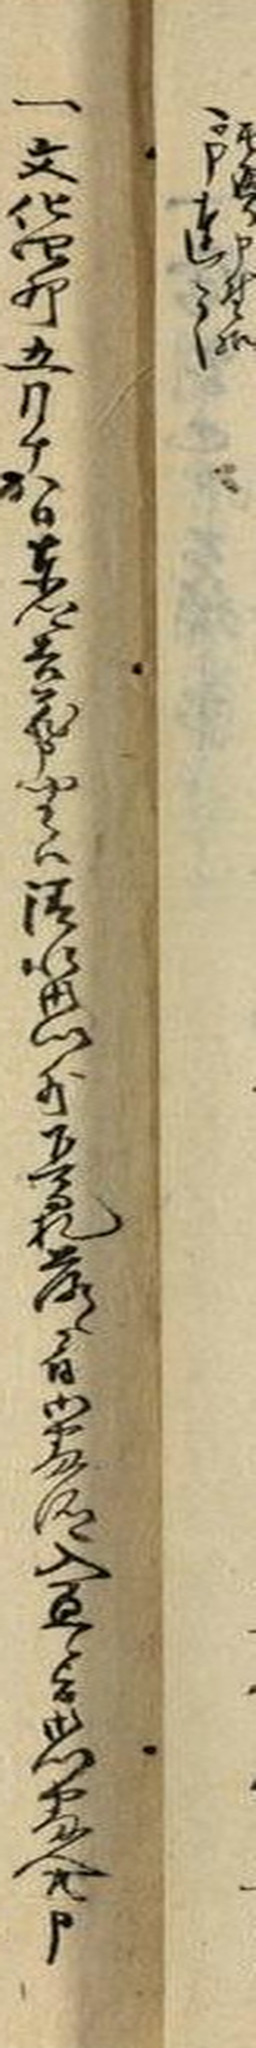一文化四卯五月十八日東郷吉蔵申聞候は清水御門外下馬札落候に付御番所へ入置候旨御門番人共申
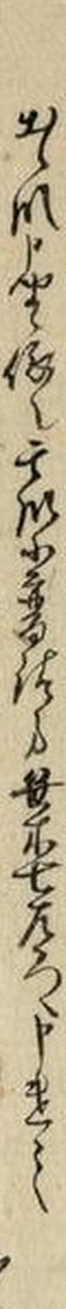出候段申聞候依之其段小普請方笹木七左衛門へ申遣之
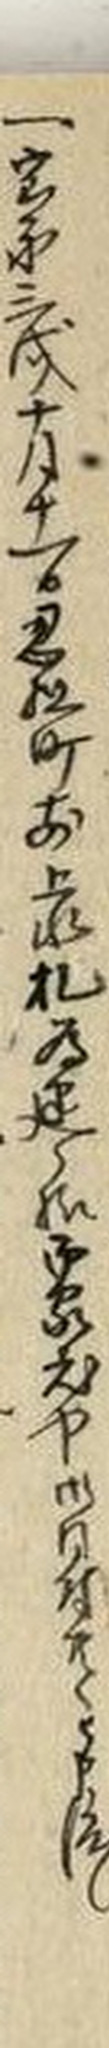一宝永三戌十月十一日忍組町前上水札為建候様御家老中御目付共へ被申渡候
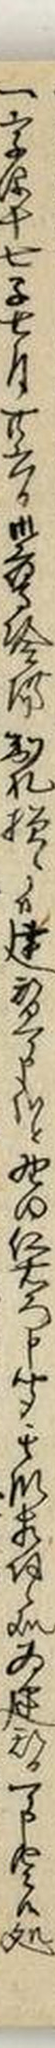一享保十七子七月廿六日御鷹冷場制札損候に付建替可申哉と野田仁右衛門申聞其段相伺候処為建替可申由に候処
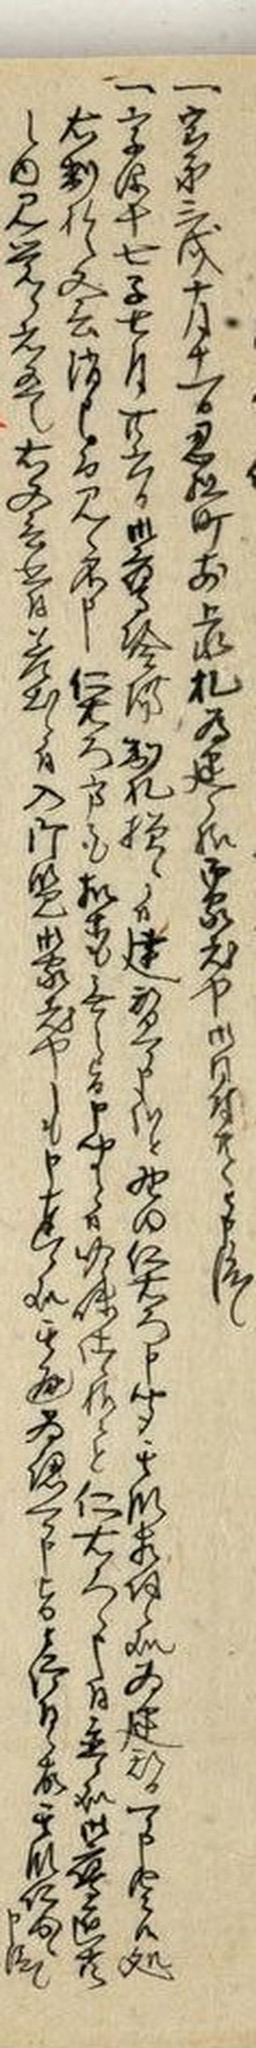一享保十七子七月廿六日御鷹冷場制札損候に付建替可申哉と野田仁右衛門申聞其段相伺候処為建替可申由に候処
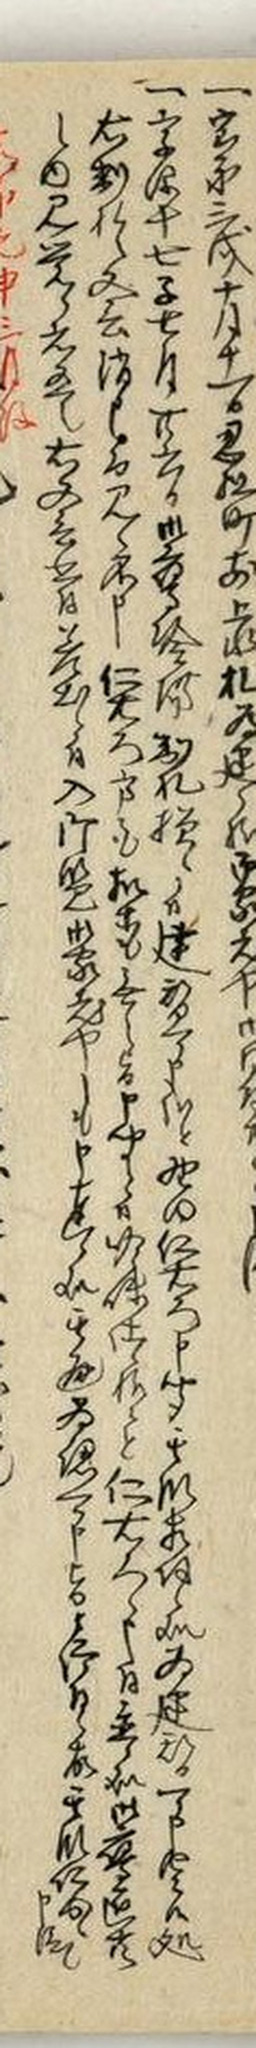右制札之文言消申候て見へ不申仁右衛門方にも控等も無之旨申聞候に付吟味仕候様にと仁右衛門へ申付置候処御鷹匠共
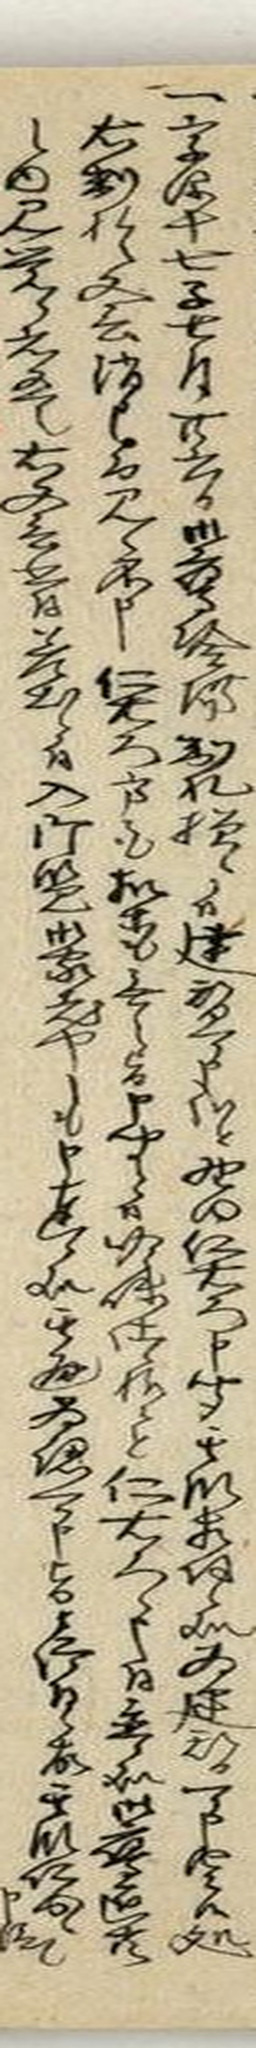之内見覚候者有之右文言書付差出候に付入御覧御家老中へも申達候処其通為認可申旨被仰付候故其段仁右衛門へ申渡候
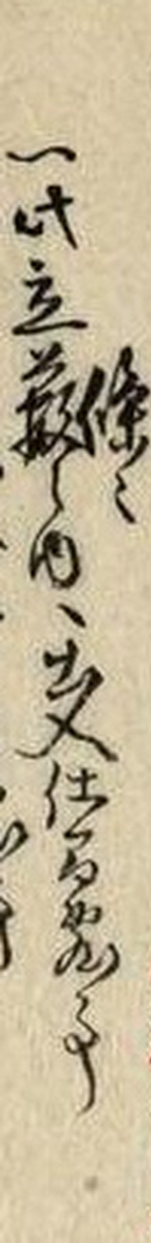一此立薮之内へ出入仕間敷事
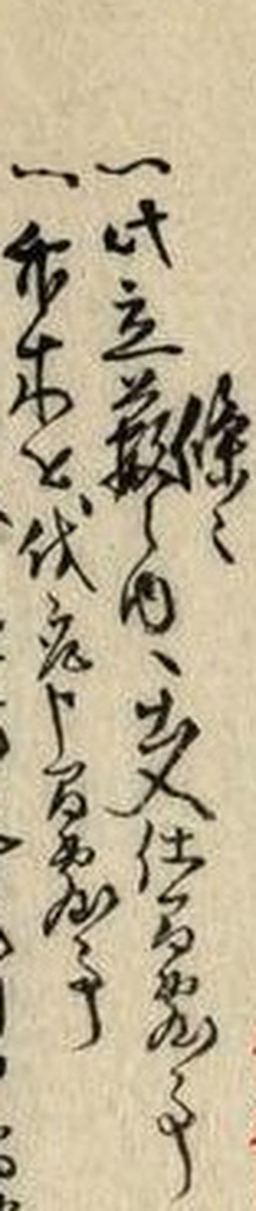一竹木を伐取申間敷事
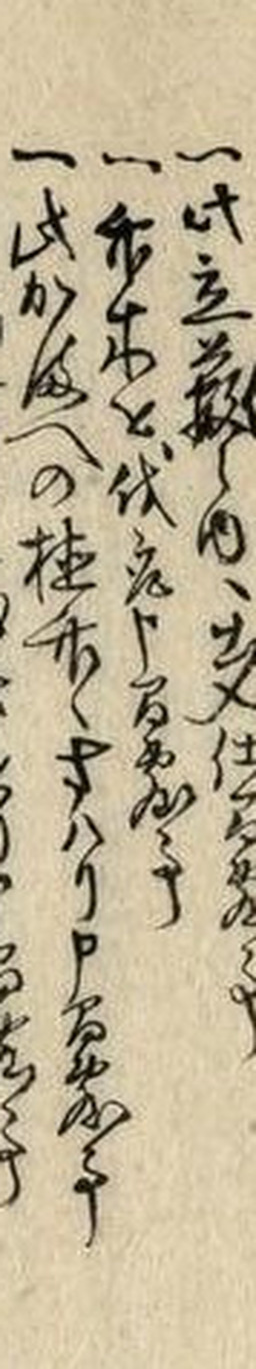一此かまへの植竹へさはり申間敷事
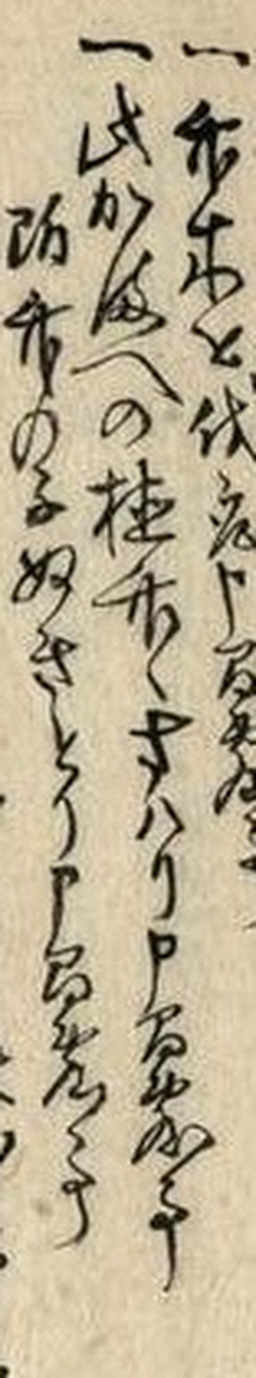附竹の子ぬきとり申間敷事
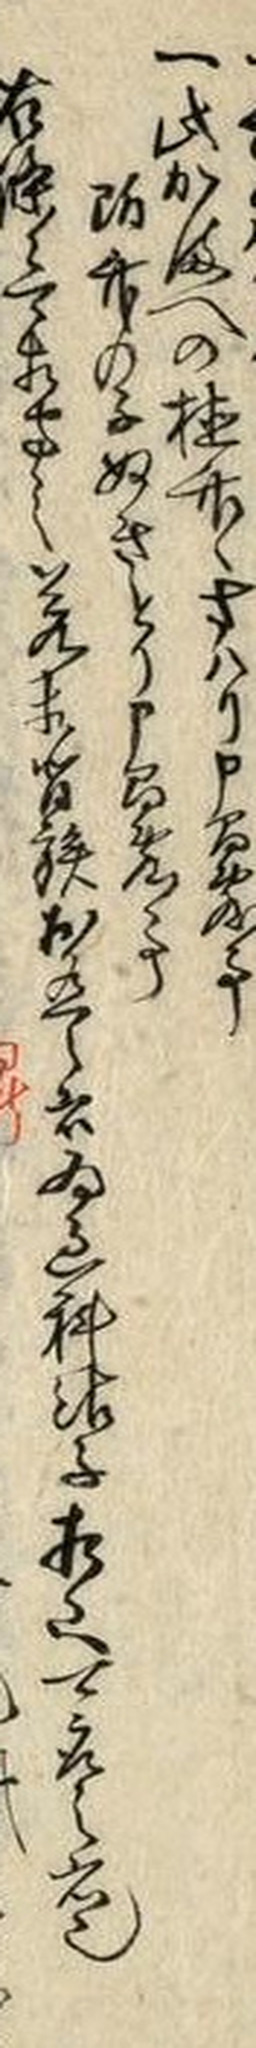右条々可相守之若相背族於有之は為過料銀子拾匁可取之者也
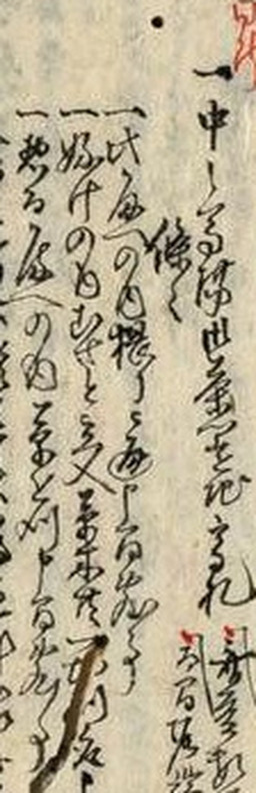一此かまへの内猥りに通申間敷事
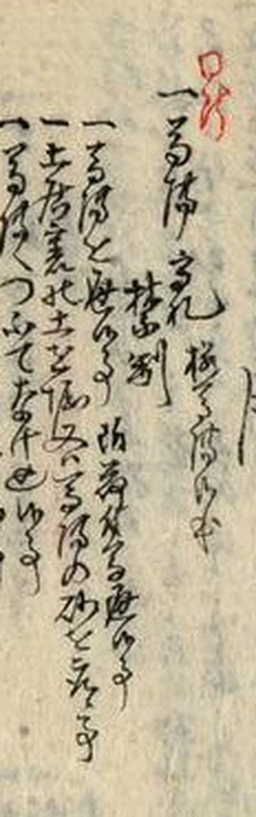一馬場を通候事附荷付馬通候事
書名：御城下諸事之部
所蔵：福井県文書館 Fukui Prefectural Archives
